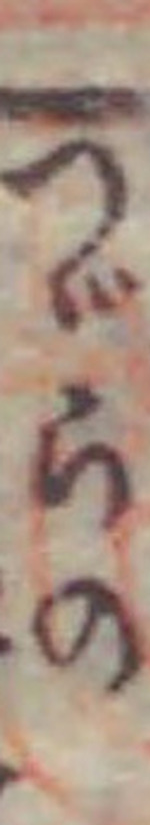つゞらの
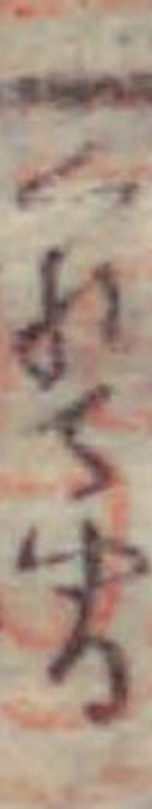くれてやる
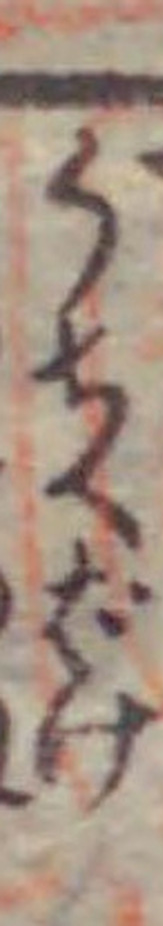うちへばけ
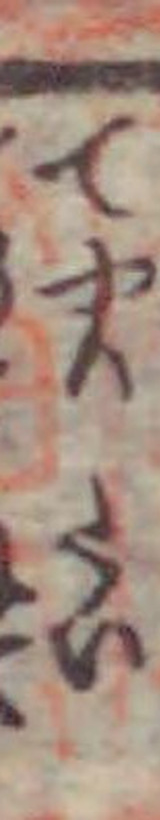てやりたい
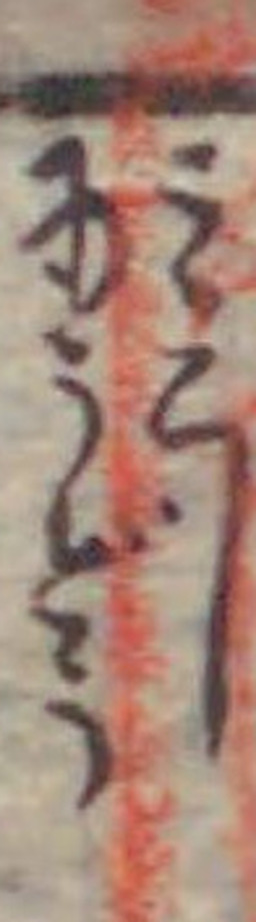にうどう
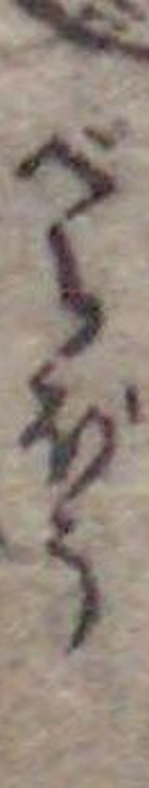べらぼう
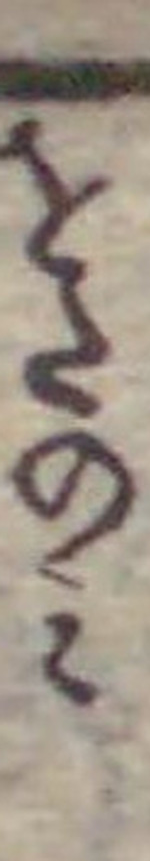をたのみ
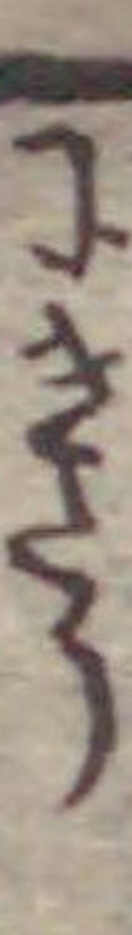にきたり
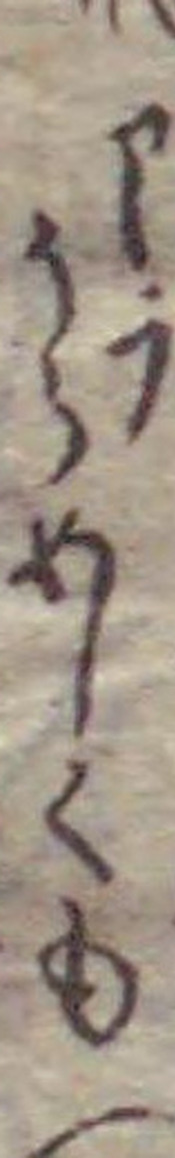うらめしくも
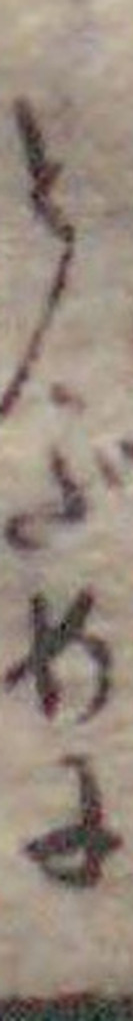とんだめに
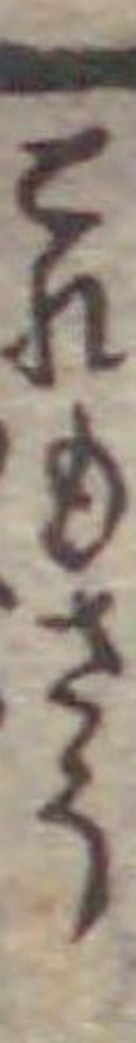これもさう
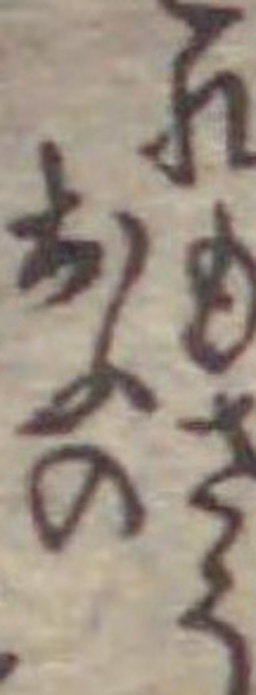おふの
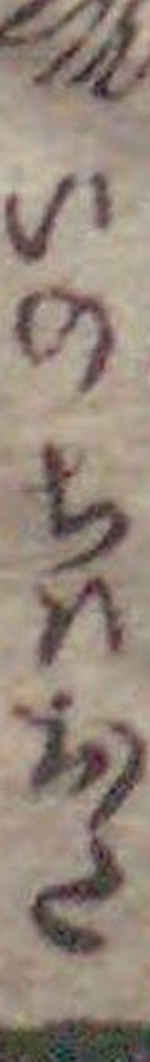いのちはおた
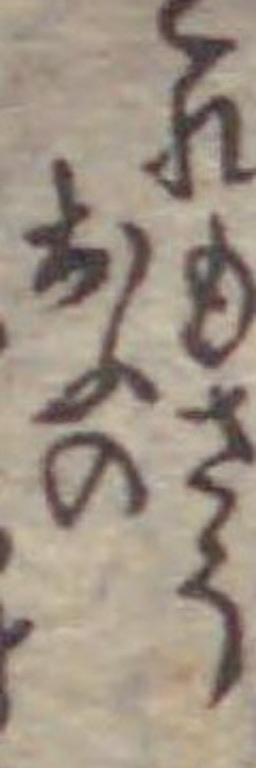おふの
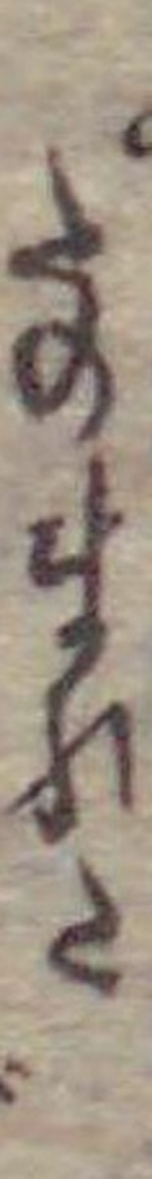たのまれた
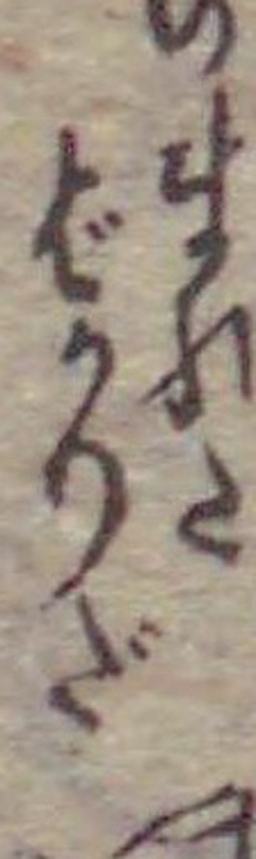ばかりだ
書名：化物見世開 : 2巻
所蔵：国立国会図書館 National Diet Library, JAPAN
